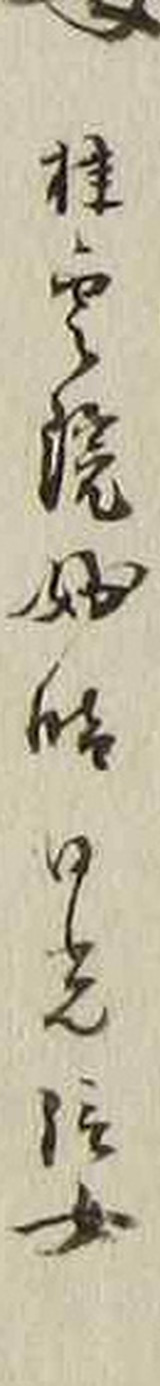桂雲院妙峙日光信女
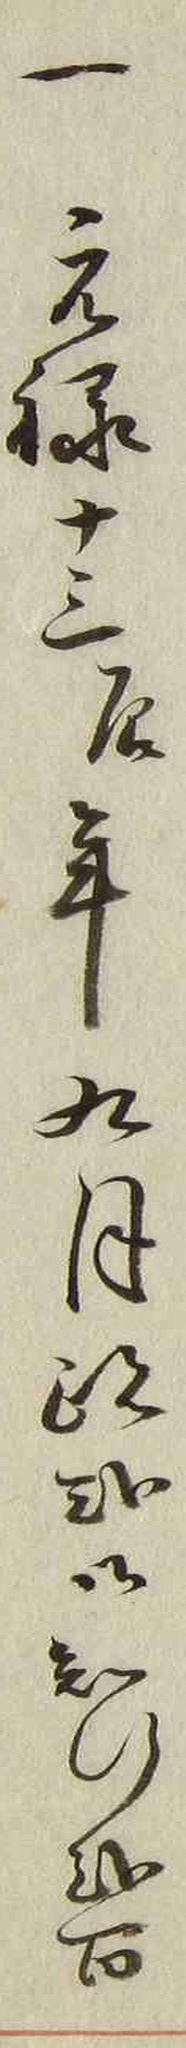一元禄十三辰年九月跡式御知行弐百

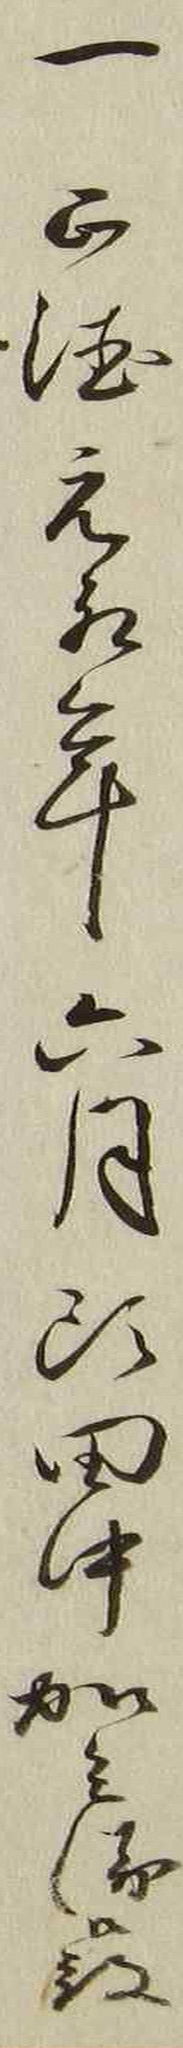一正徳元卯年六月頭田中加兵衛御役
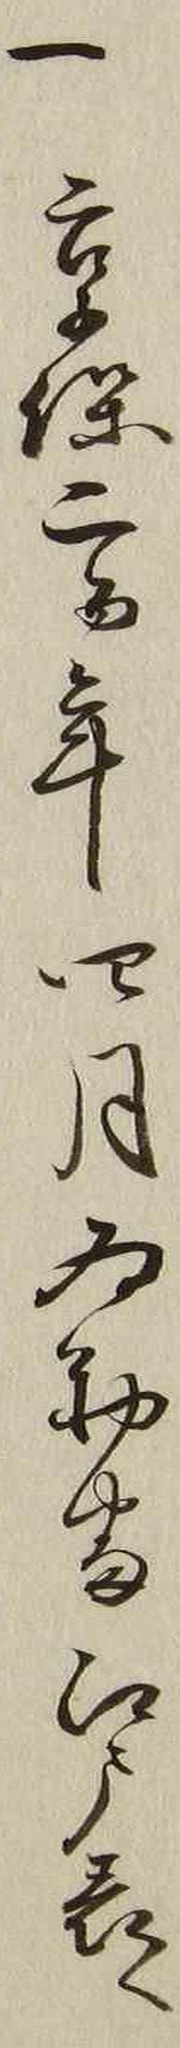一享保二酉年四月勤番之為江戸表へ
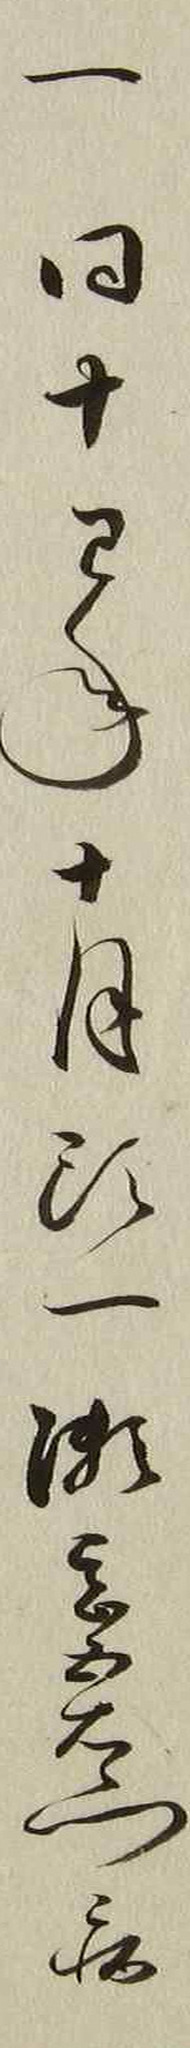一同十巳年十月頭一瀬玄五右衛門病
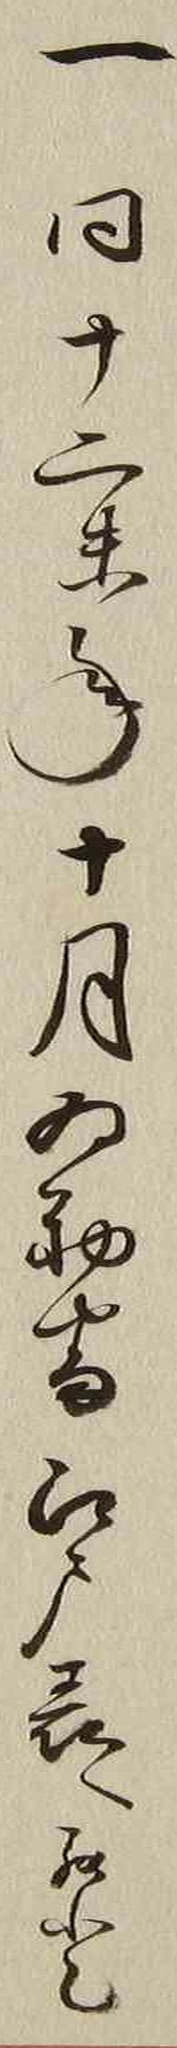一同十二未年十月勤番之為江戸表へ罷り登り
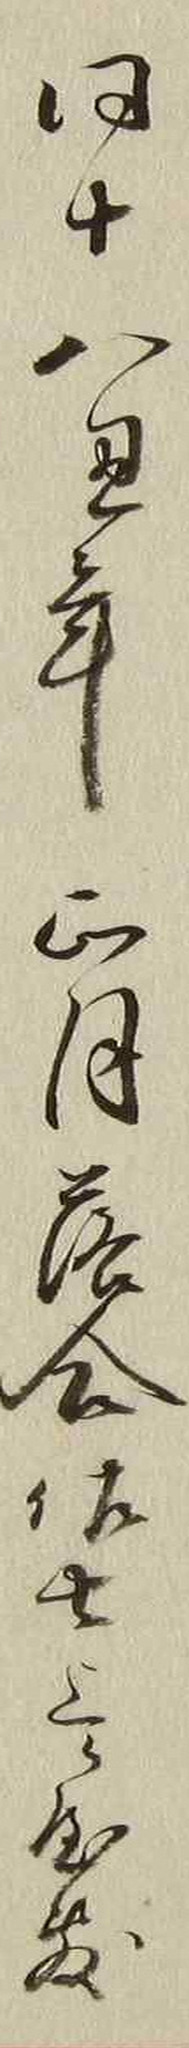一同十八丑年正月落合佐七上ケ屋敷
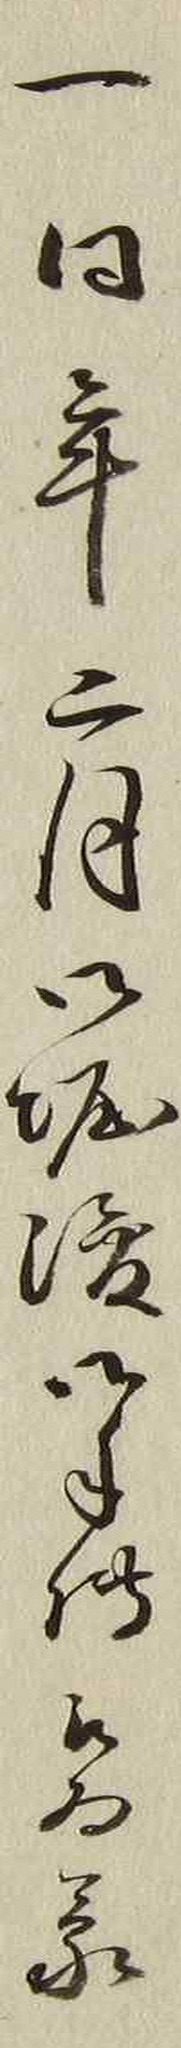一同年二月御堀浚い御手伝い蒙らせ
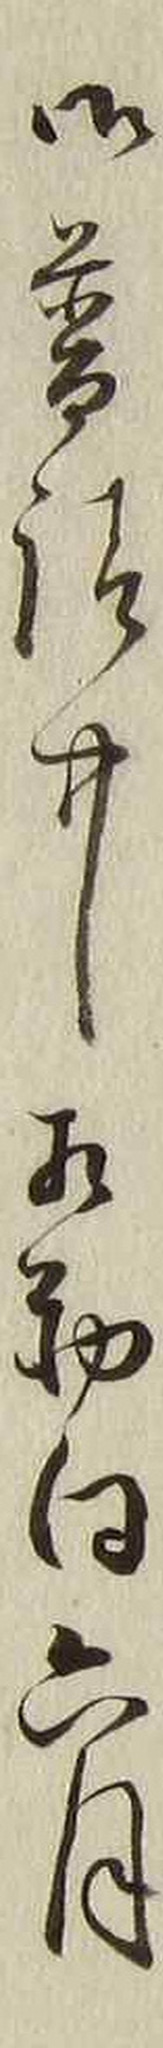御普請中相勤め同六月
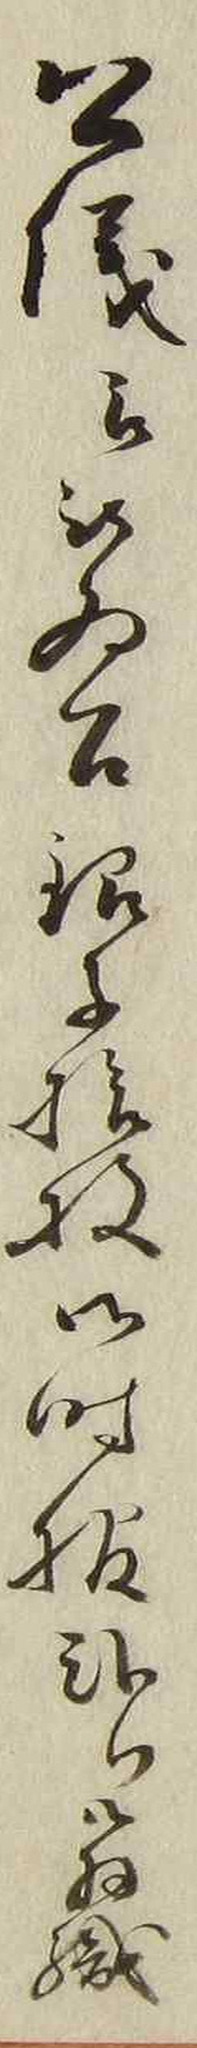公儀へ召させられ銀子拾枚御時服弐ッ御羽織

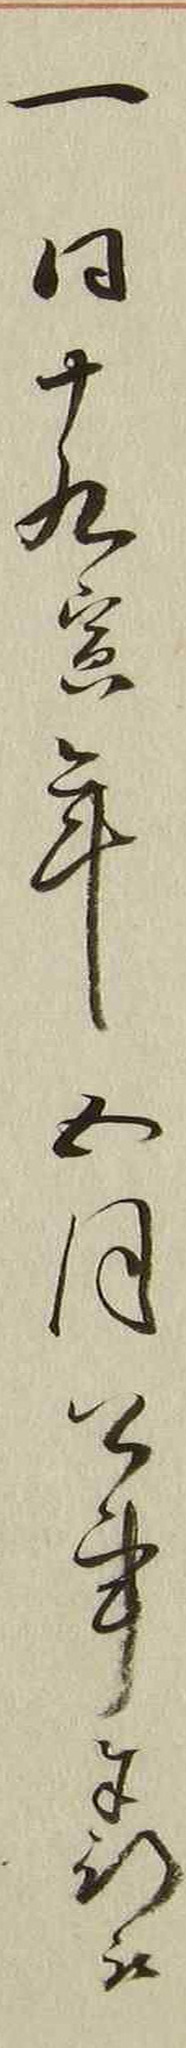一同十九寅年五月公事奉行
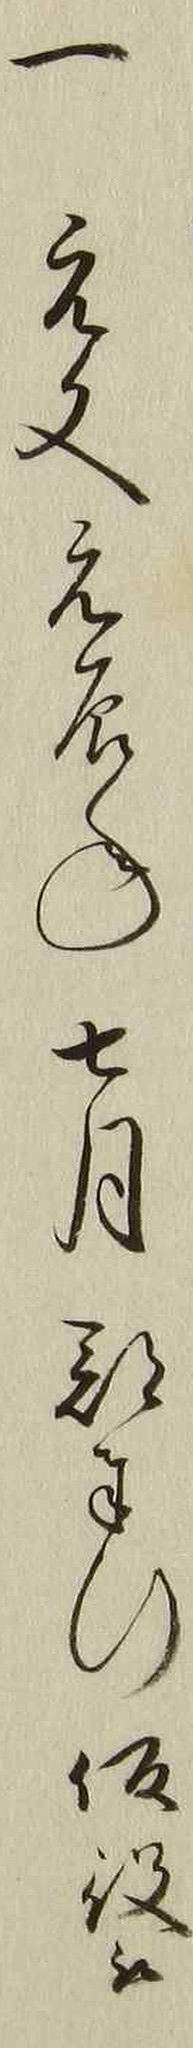一元文元辰年七月郡奉行仮役
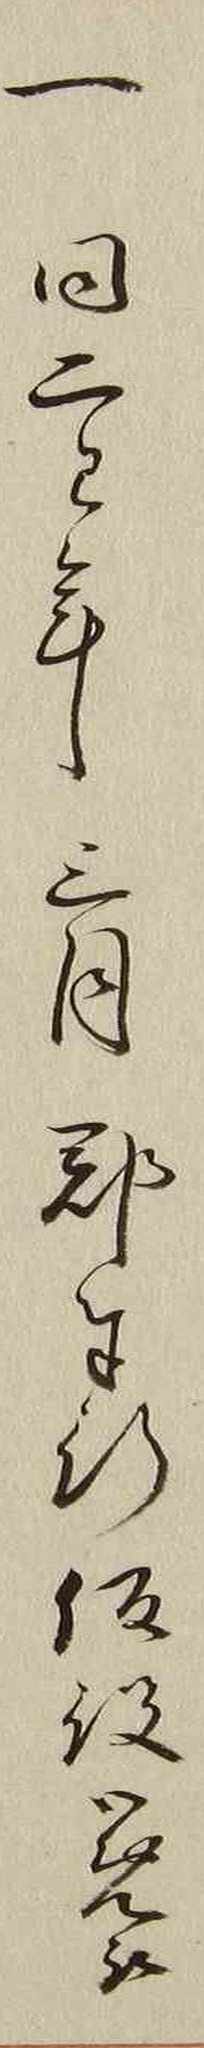一同二巳年三月郡奉行仮役御免
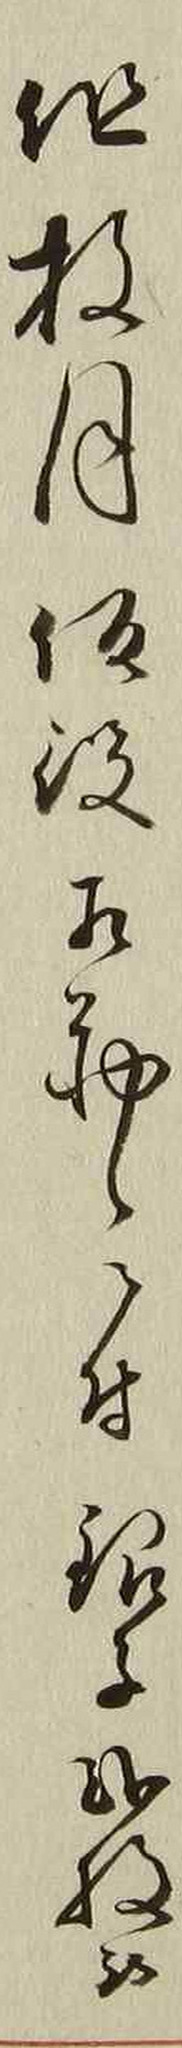但し数月仮役相勤め候ニ付き銀子弐枚
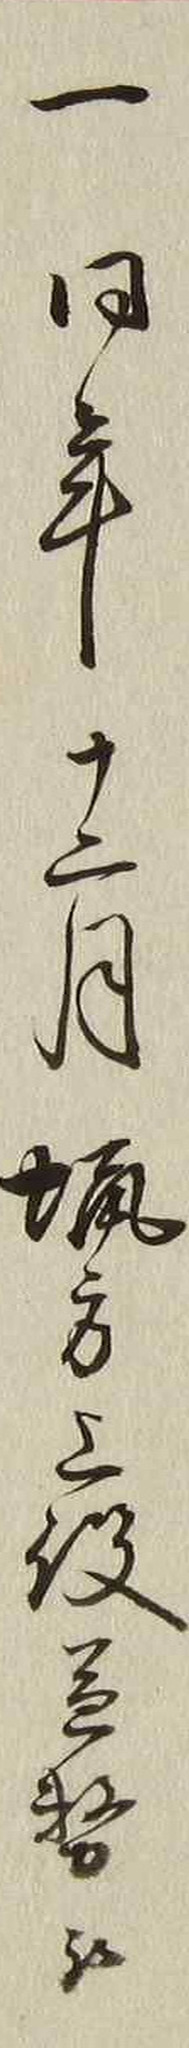一同年十二月蝋方上役兼務
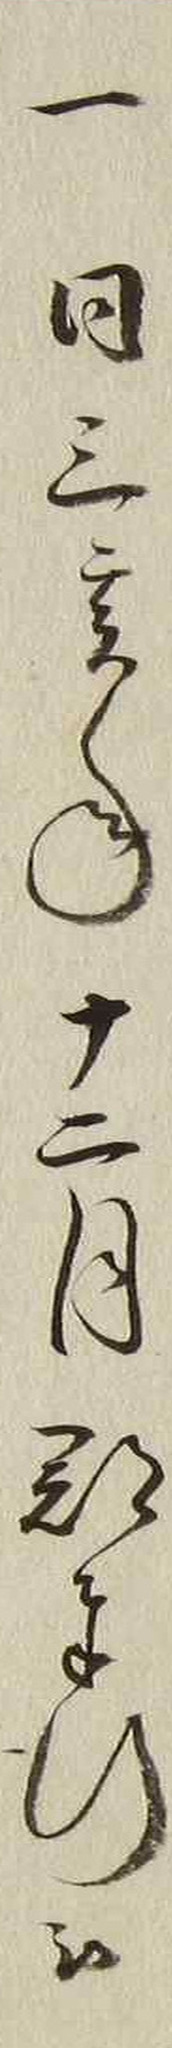一同三亥年十二月郡奉行
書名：諸士系譜　巻之20　い之部20
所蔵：会津若松市立会津図書館
